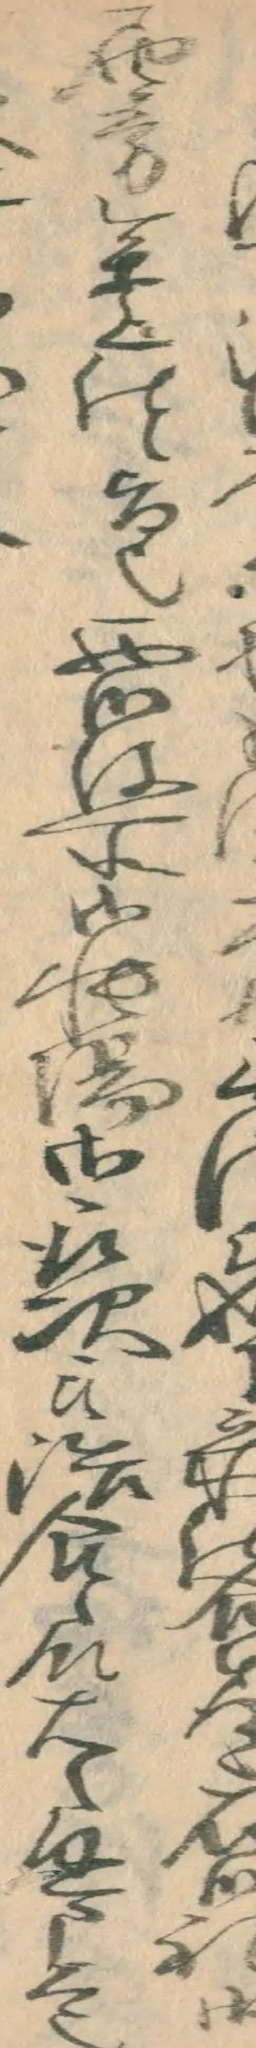届旁参上仕候旨也西御役所御帳場御取次被詰合候故右之通申上也

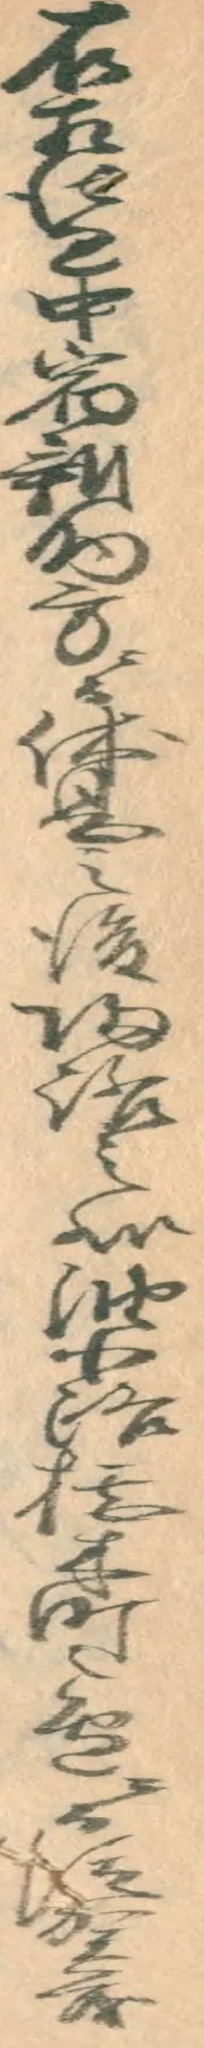右相仕廻中宿新助方ニ而休息之後帰路之処油小路椹木町之辺ニ而従賀茂
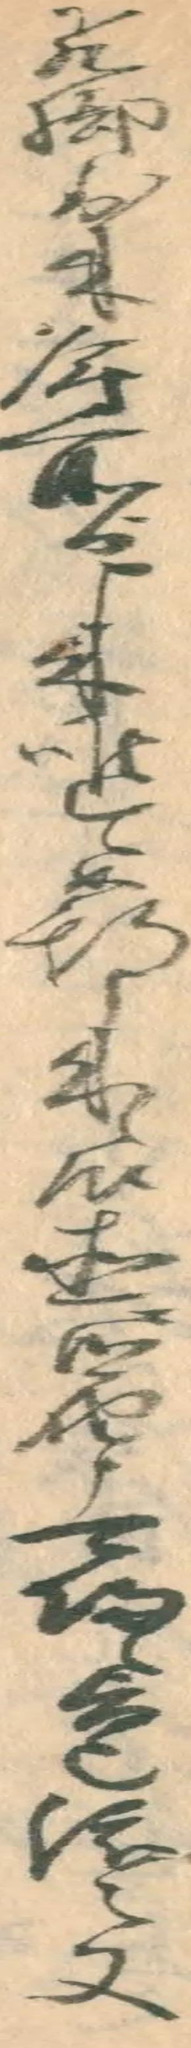飛脚到来尋所ゟ申来唯今如斯申来候故直ニ御届申可帰候旨也依之又
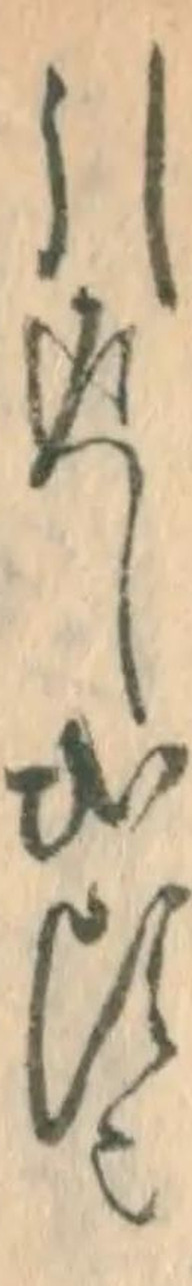引返し出頭也
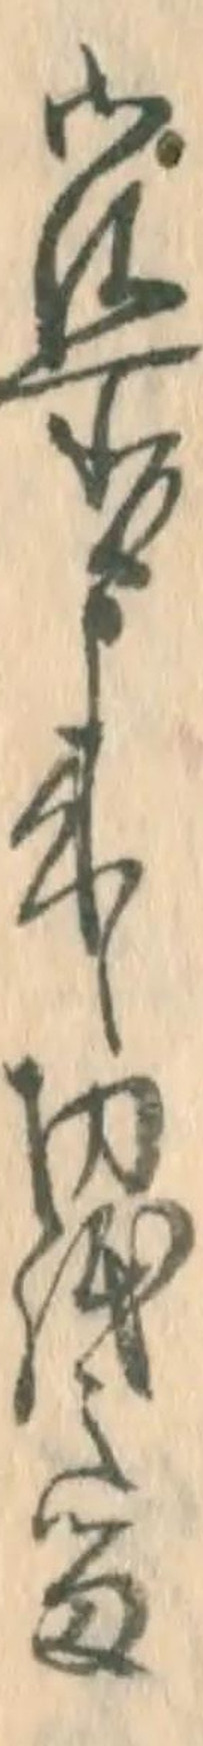御役所ゟ申来候切紙之留
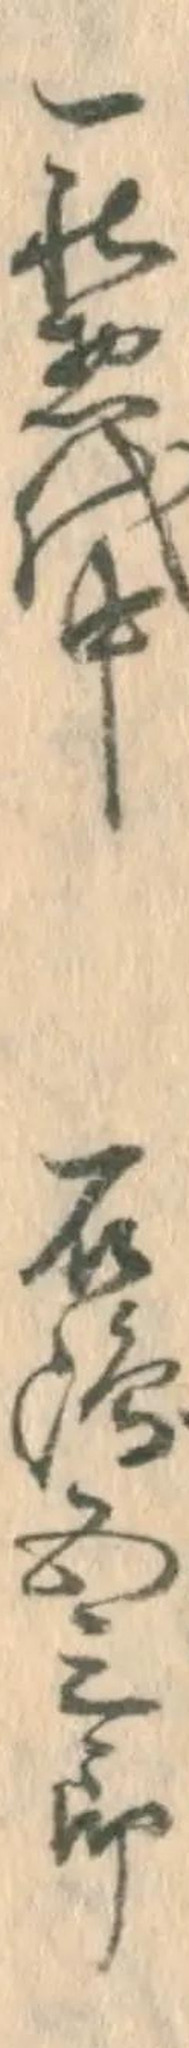一社惣代中石嶋五三郎
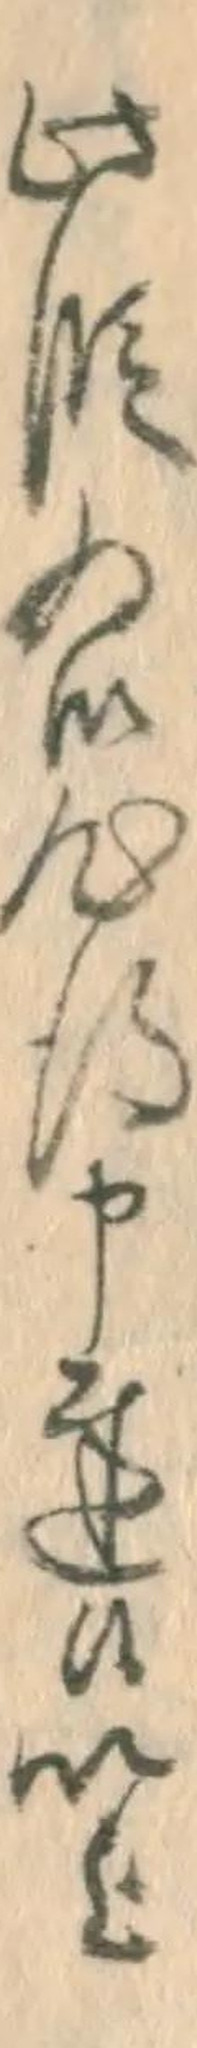此段為御心得申達候以上
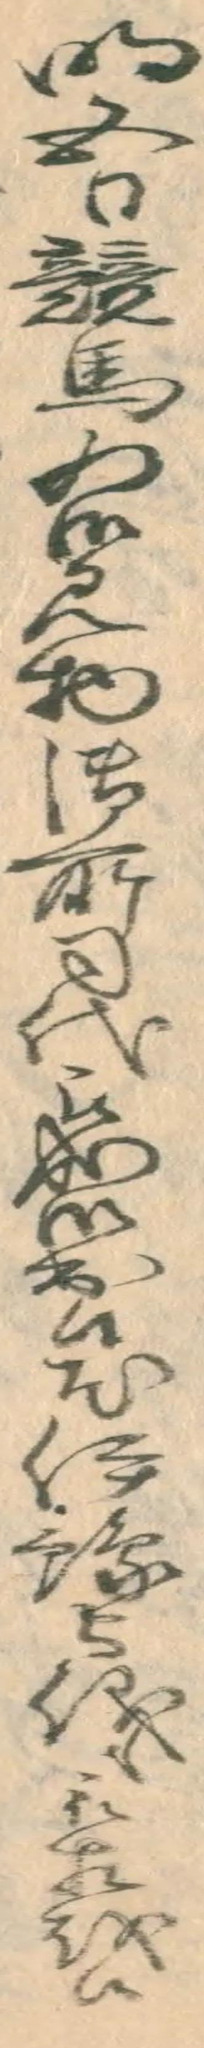明五日競馬為御見物御所司代被成御出候尤伊予守儀も被相越候
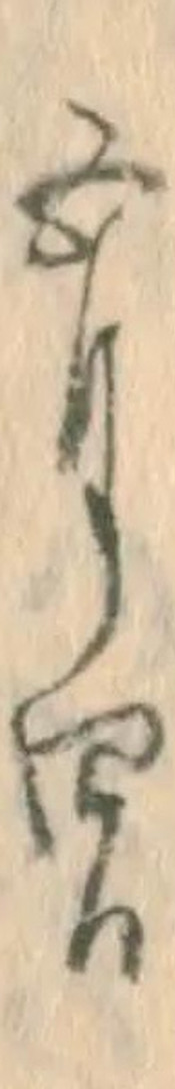五月四日
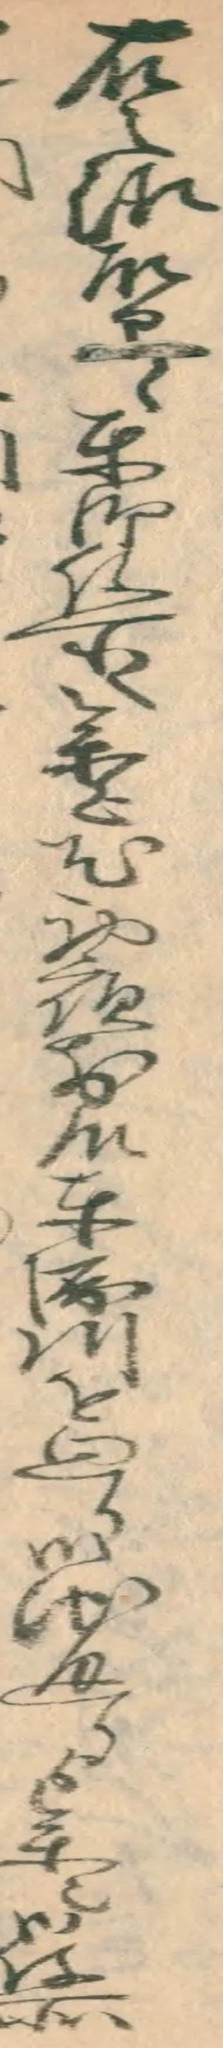右之趣故早々東御役所へ参上尤初夜前故東堀川を廻り御池通りゟ参也御役所
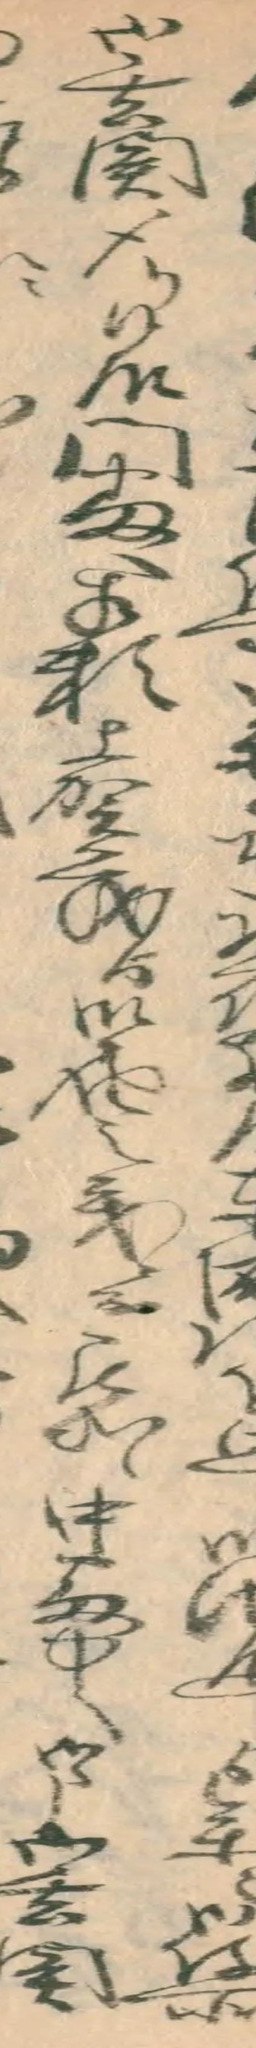御玄関〆り候故門番へ相頼上賀茂ゟ御届之義ニ而罷出候中番中へ御申御玄闕
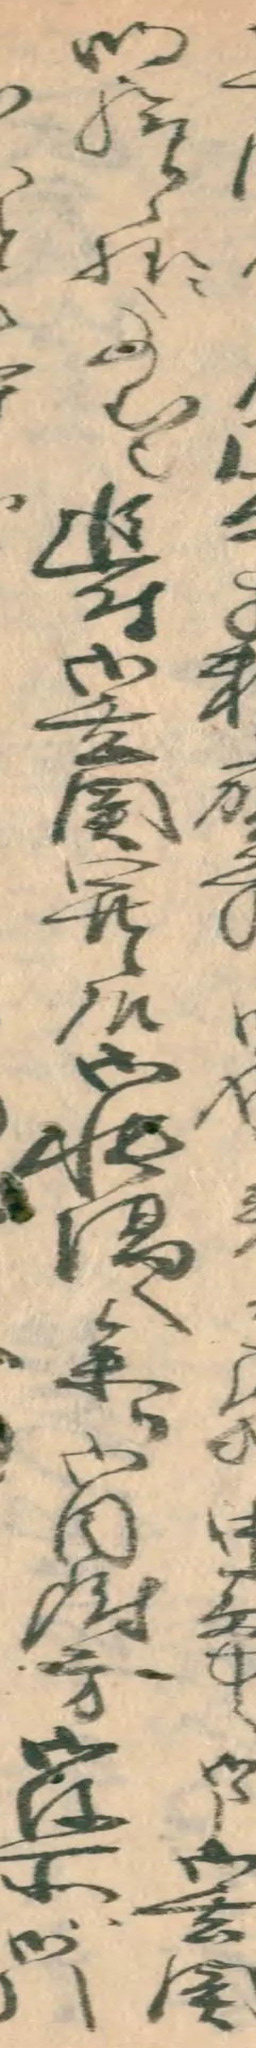明給り候ニたのむ也追付御玄関開候故御帳場へ参り御目付方御役所ハ御引
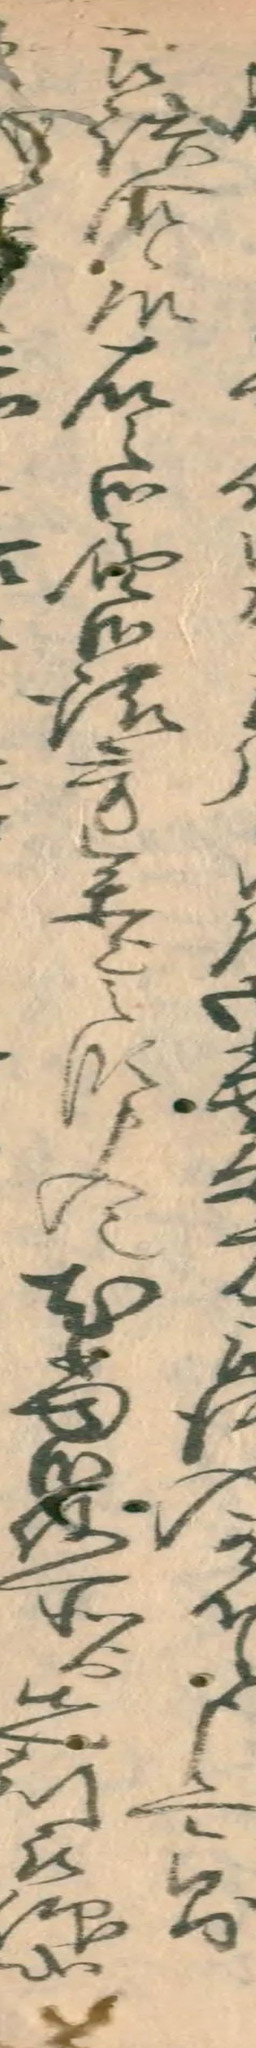被詰合候故右之御届御請旁参上之段申入也尤当御役所ゟ先刻被仰出
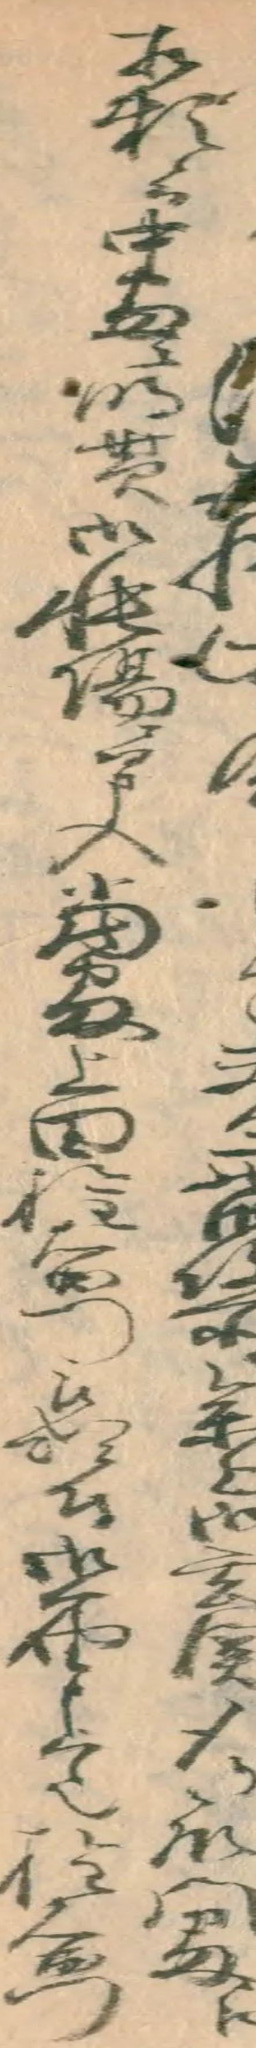相頼候而中番ニ明貰御帳場ニ而申入当番上田権右衛門被出ニ付御届申上也権右衛門
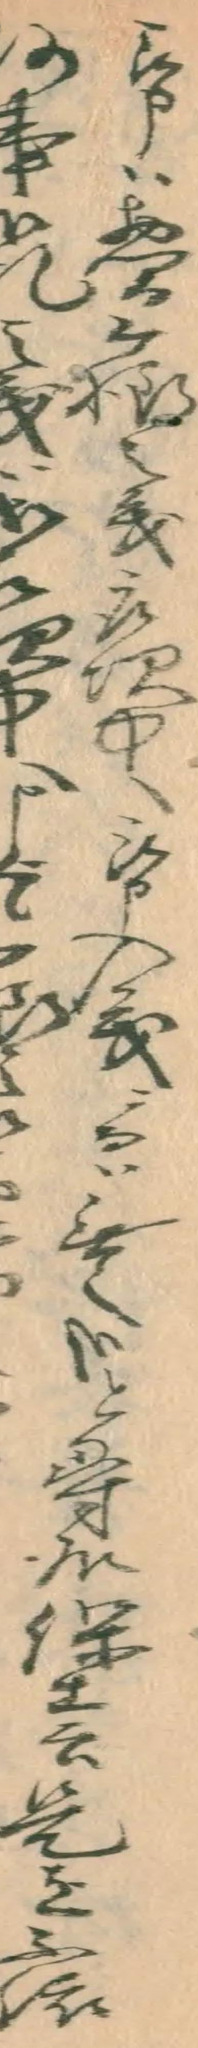被申ハ惣而ケ様之義取次中へ被申入義ニ而ハ無之哉と尋故保土言是迄不依
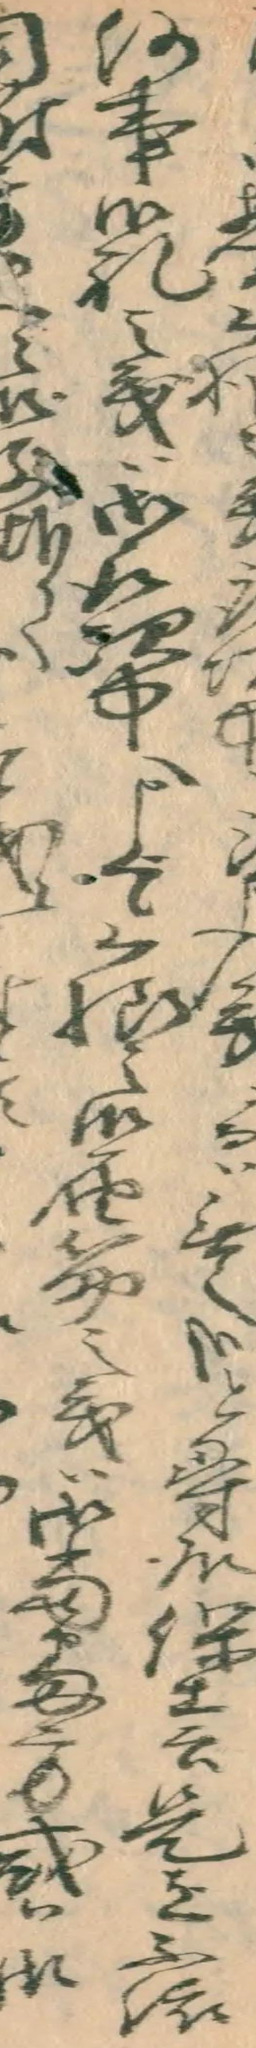何事御礼之義ハ御取次中へ申上候ケ様之御届筋之義ハ御当番方或ハ御
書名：賀茂社記録. 第58冊
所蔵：国立国会図書館 National Diet Library, JAPAN
